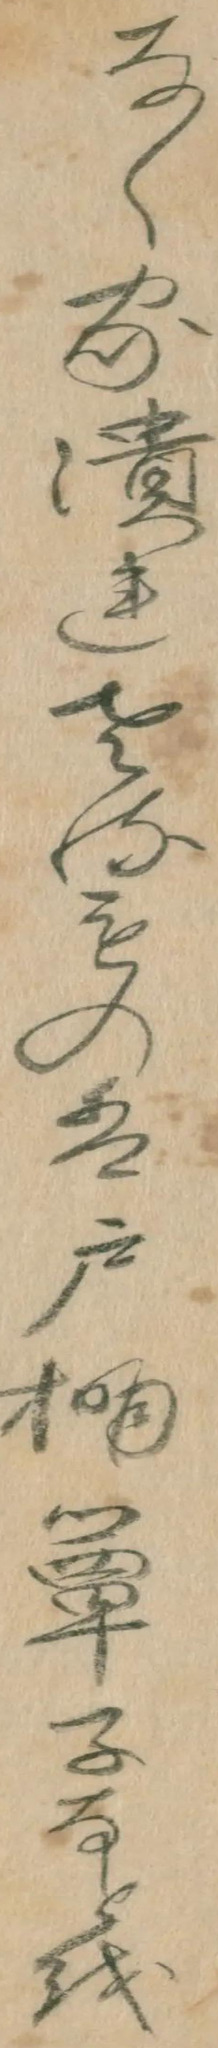なく家潰れさるものは戸棚箪子なとを
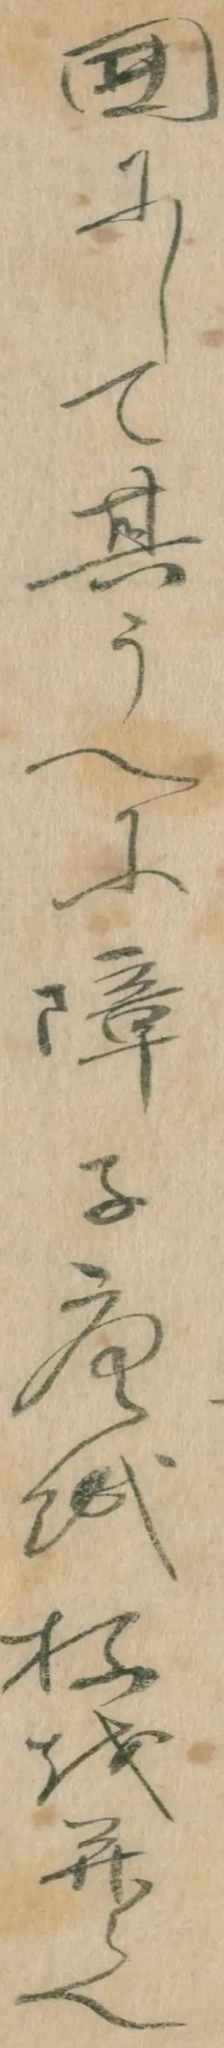囲にして其うへに障子唐紙抔を并らへ
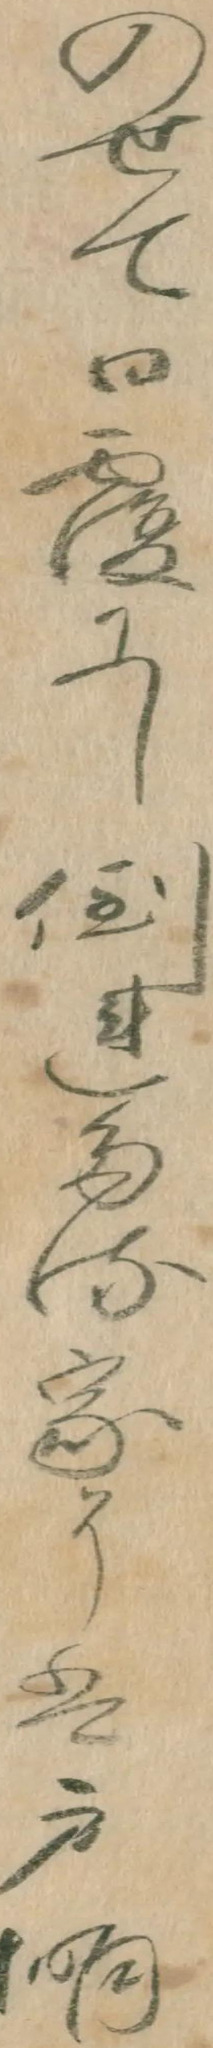のせて日覆にし倒れたる家には戸棚
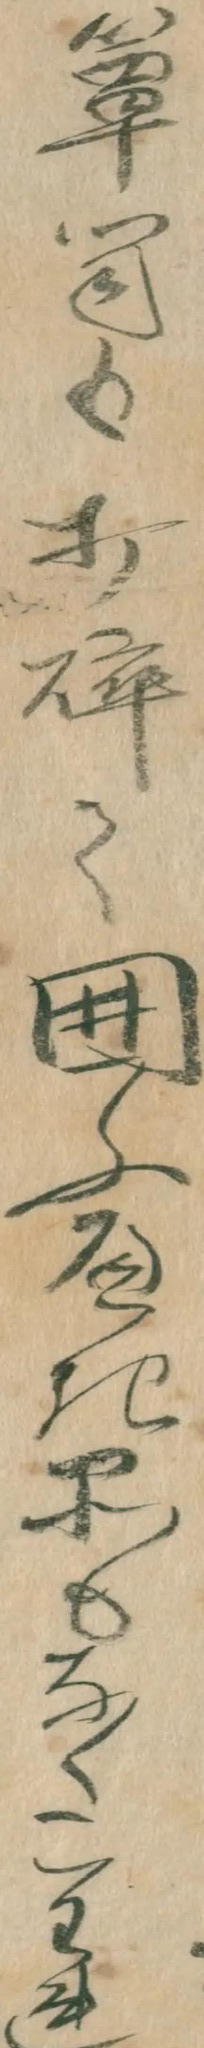箪笥も打砕て囲ふへき品もなくこわれ
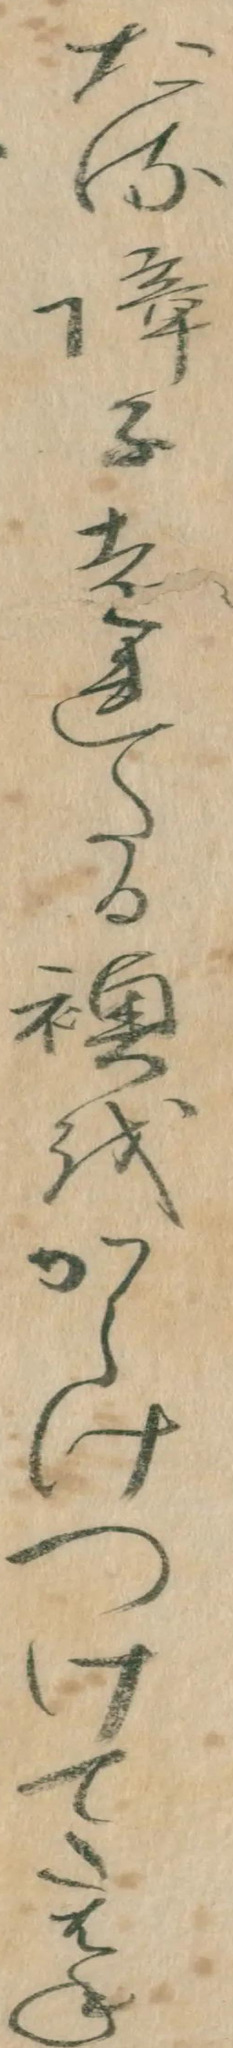たる障子をれたる襖をからけつけてたはね
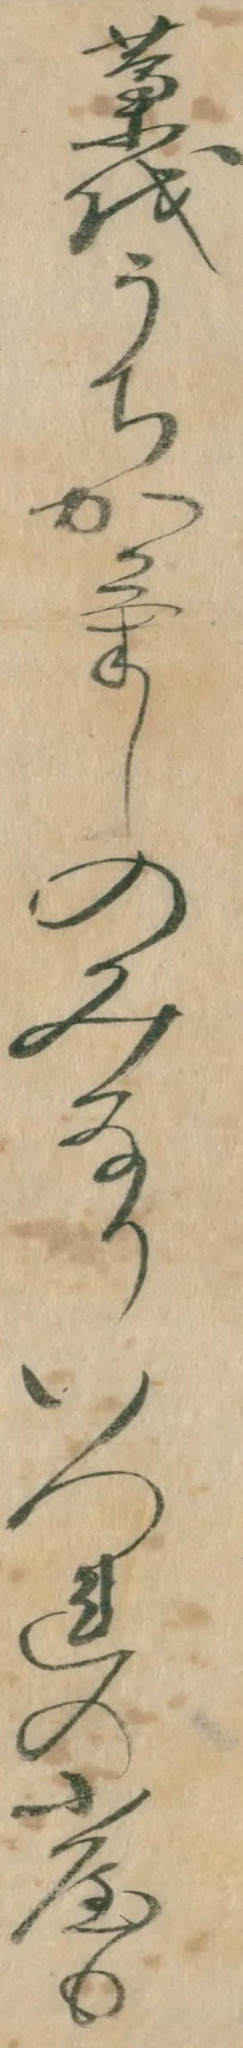藁をうちかけしのみなりいつれの小屋も
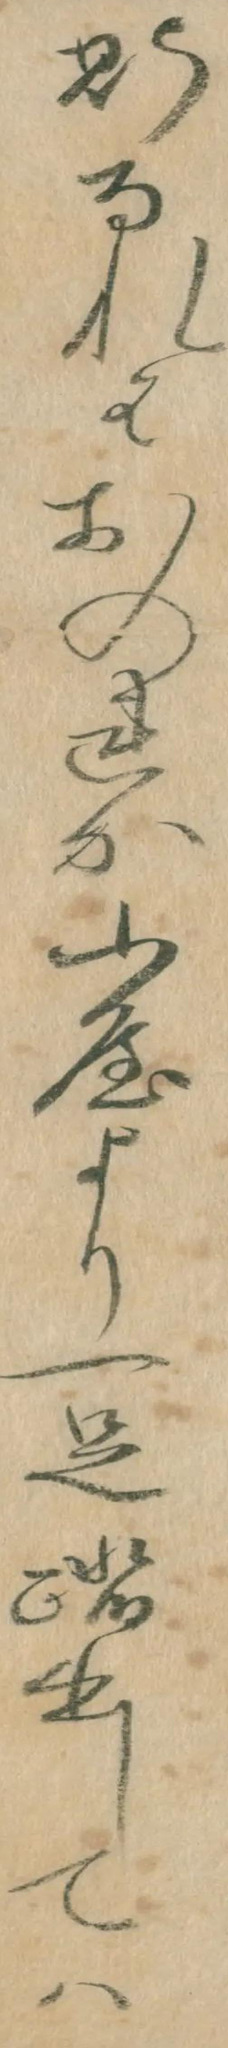斯なれはおのれか小屋より一足踏出しては
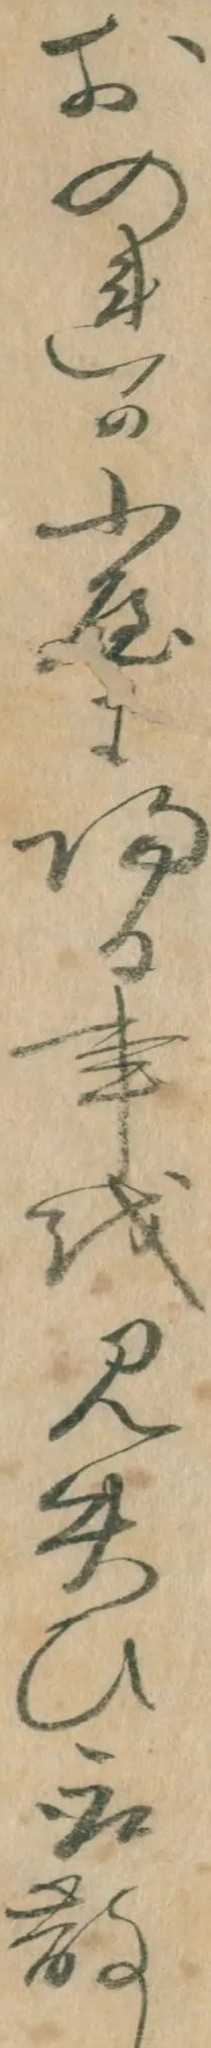おのれか小屋に帰る事を見失ひ取散し

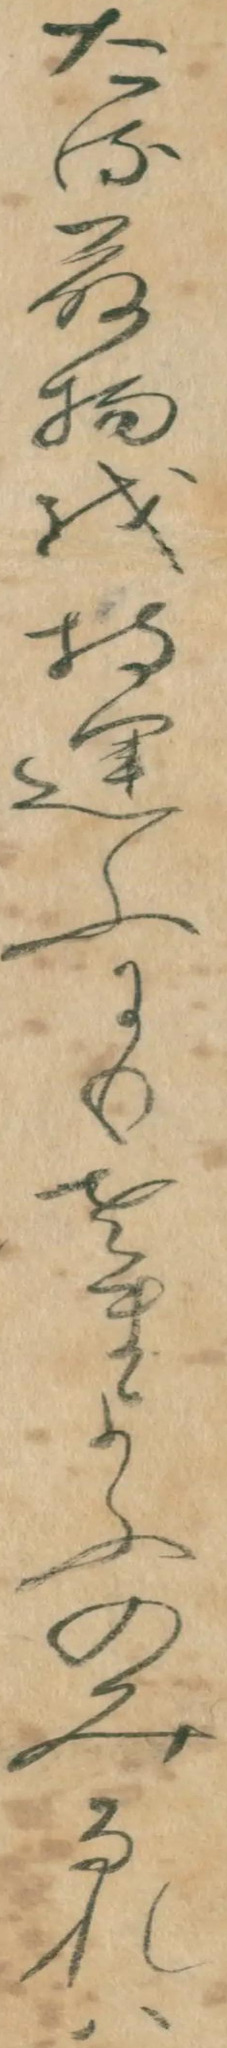たる荷物を持運ふにもさまよふのみなれは
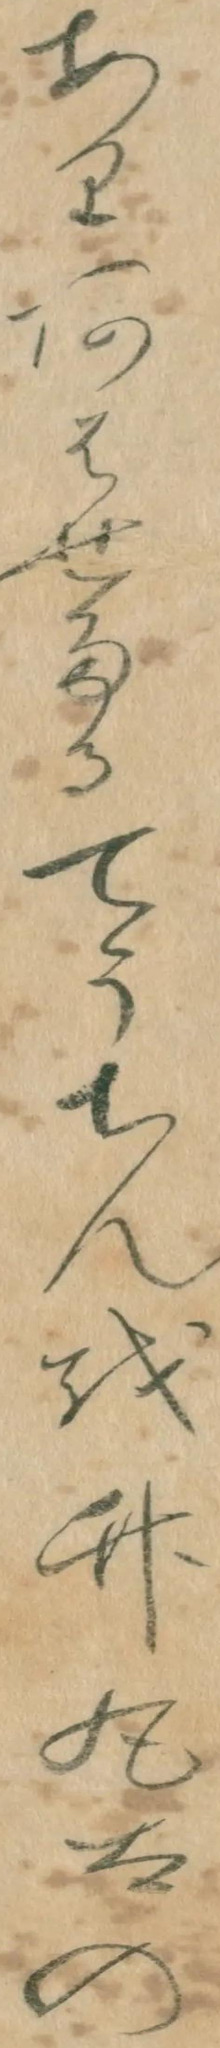ありあわせたるてうちんを竹丸太の
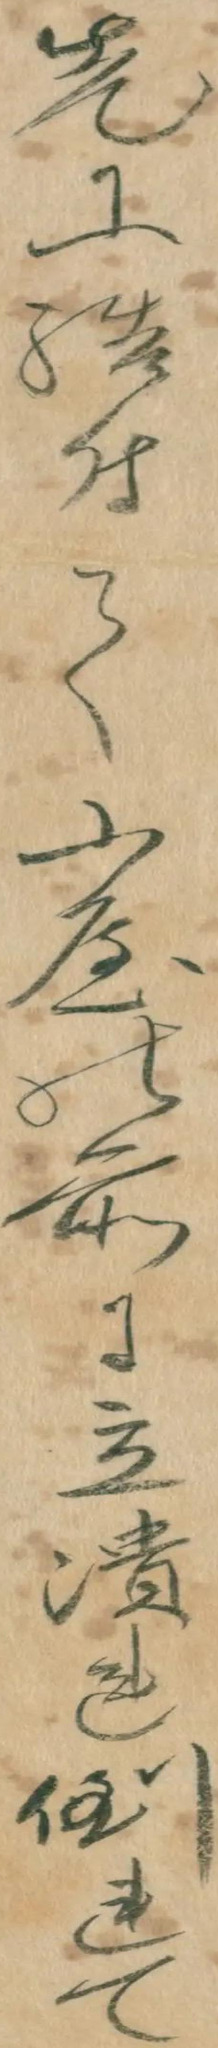先に結付て小屋の前に立潰れ倒れて
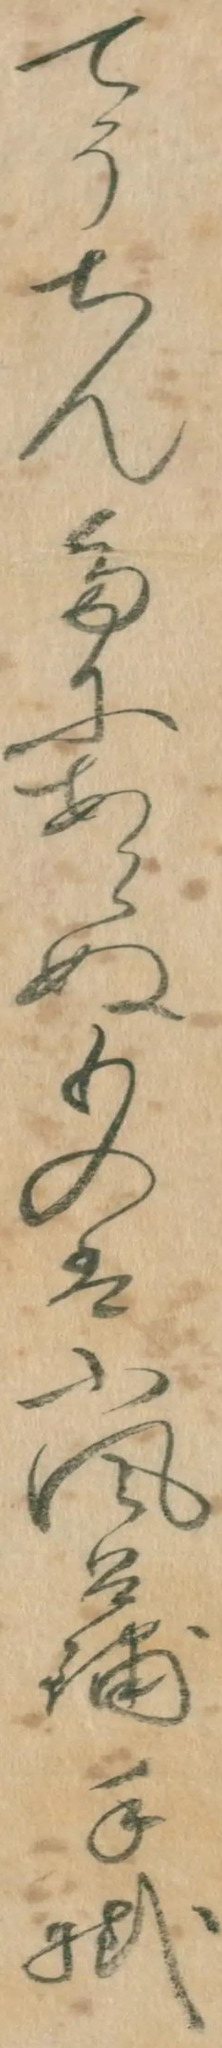てうちんたにあらぬものは小風呂鋪手拭
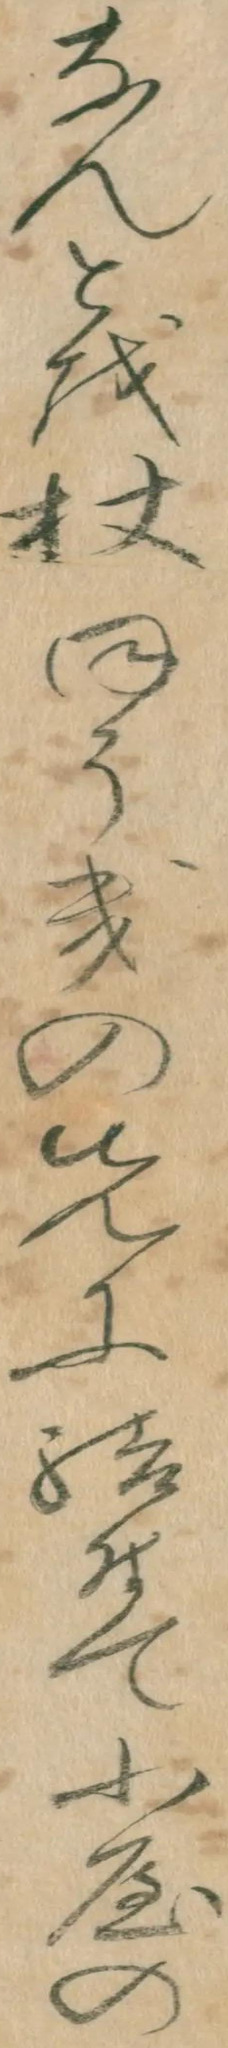なんとを杖ほうきの先に結付て小屋の
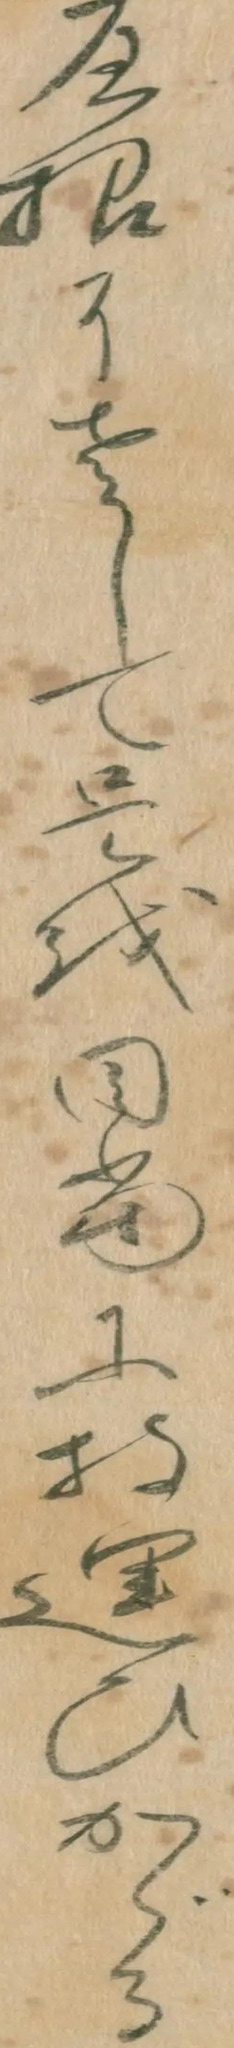屋根にさして是を目当に持運ひかゝる
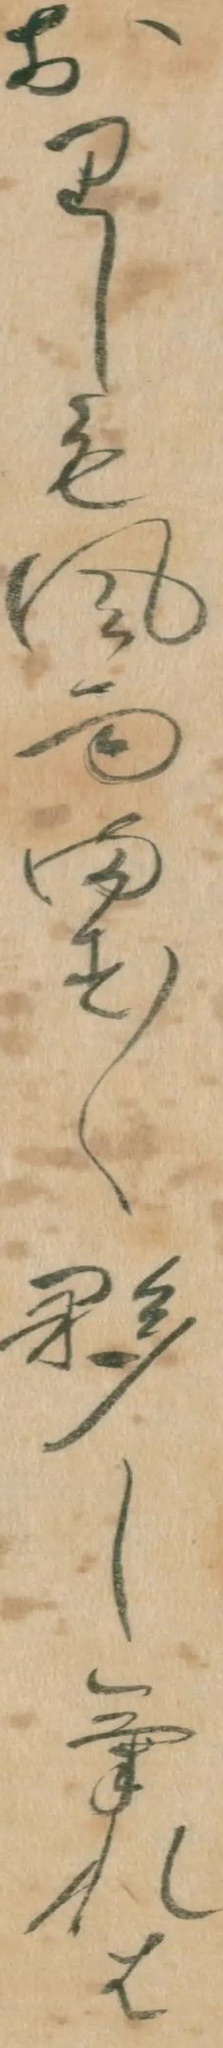おりしも風雨ます〳〵夥しけれは
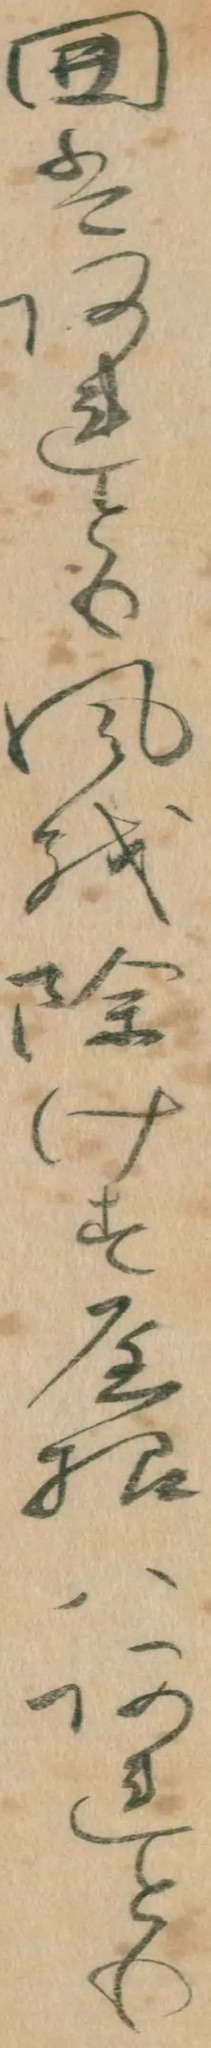囲はあれとも風を除けす屋根はあれとも
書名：俗語之種. [4]
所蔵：国立国会図書館 National Diet Library, JAPAN
